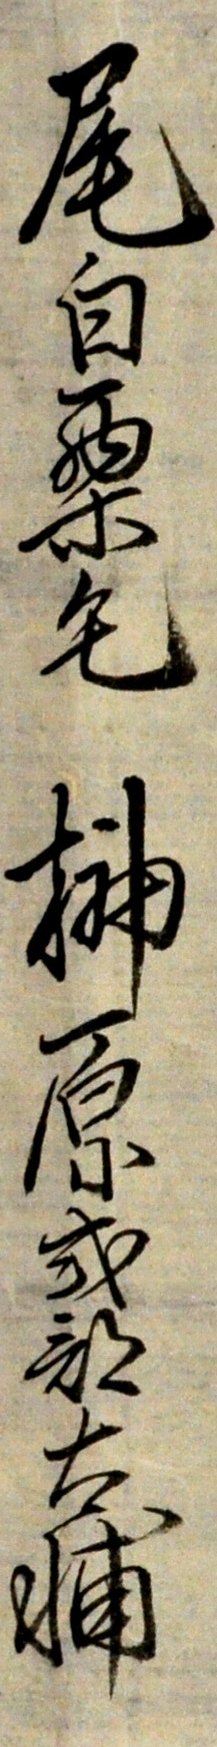尾白栗毛榊原式部太輔
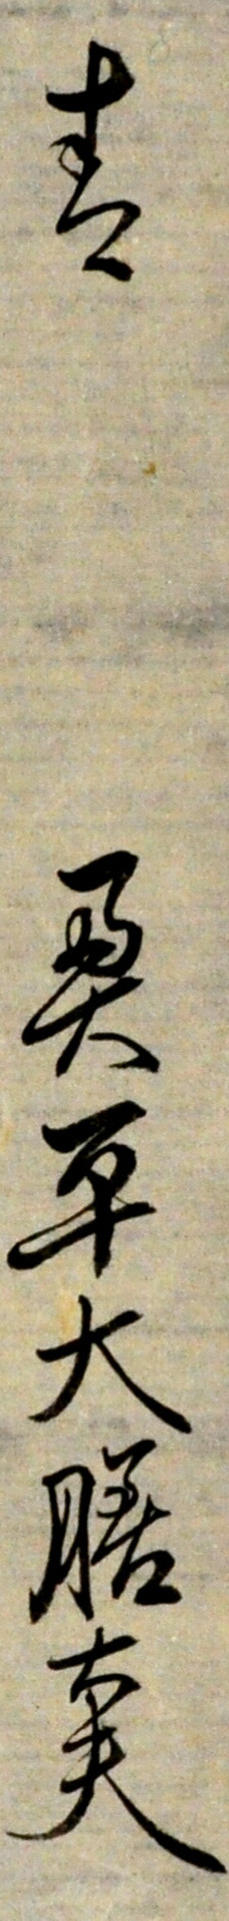青奥平大膳大夫
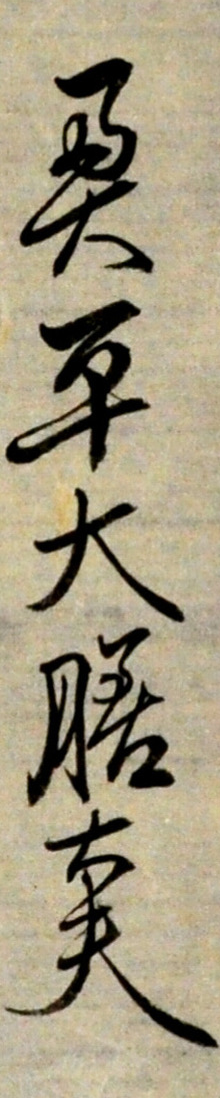青奥平大膳大夫
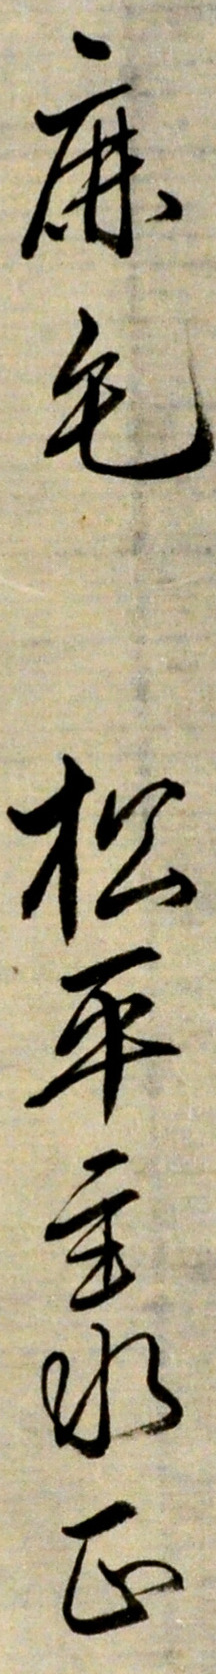鹿毛松平主水正
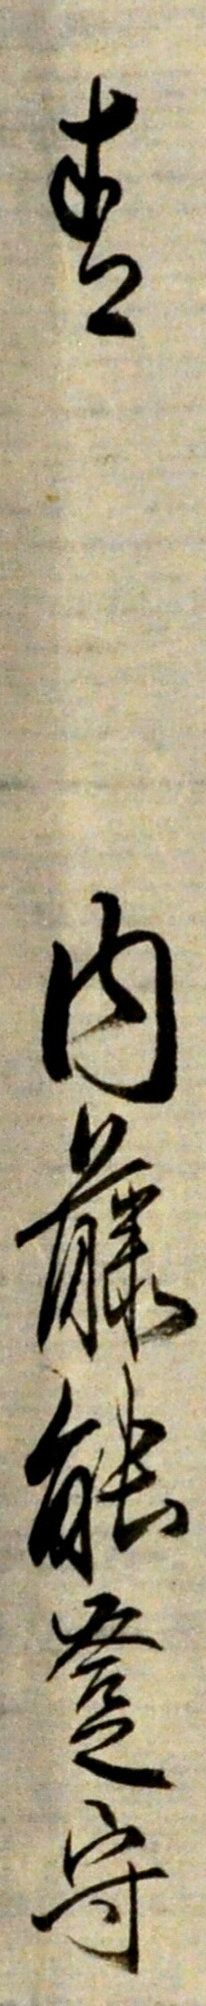青内藤能登守
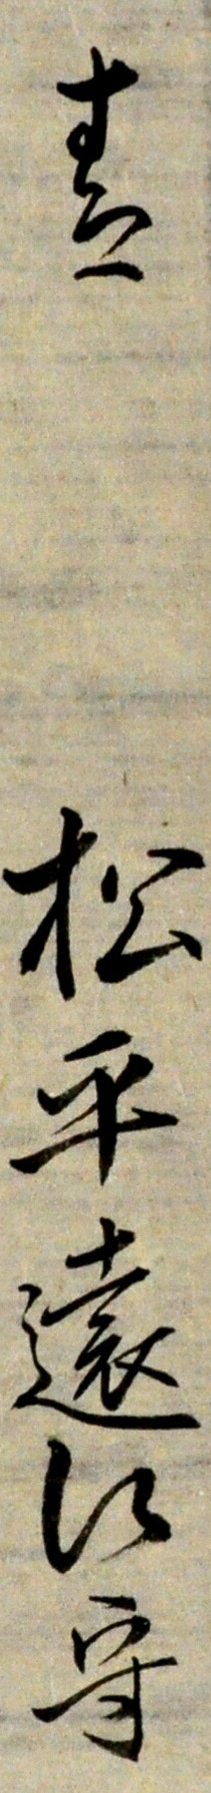青松平遠江守
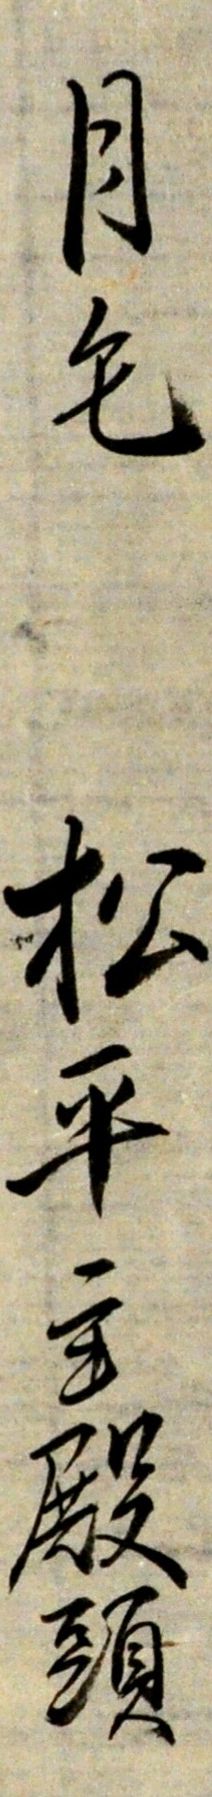月毛松平主殿頭

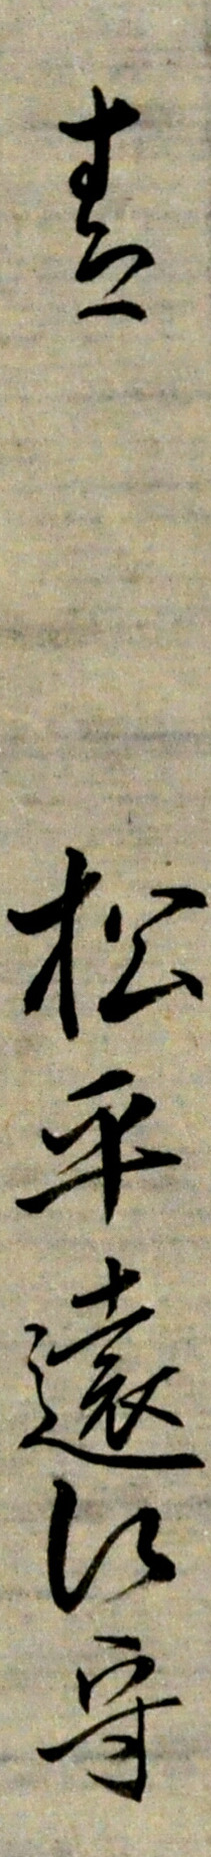青松平丹波守
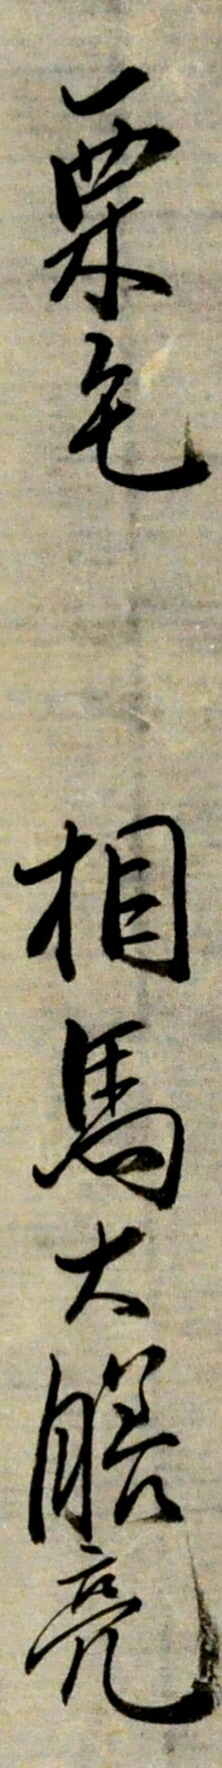栗毛相馬大膳亮
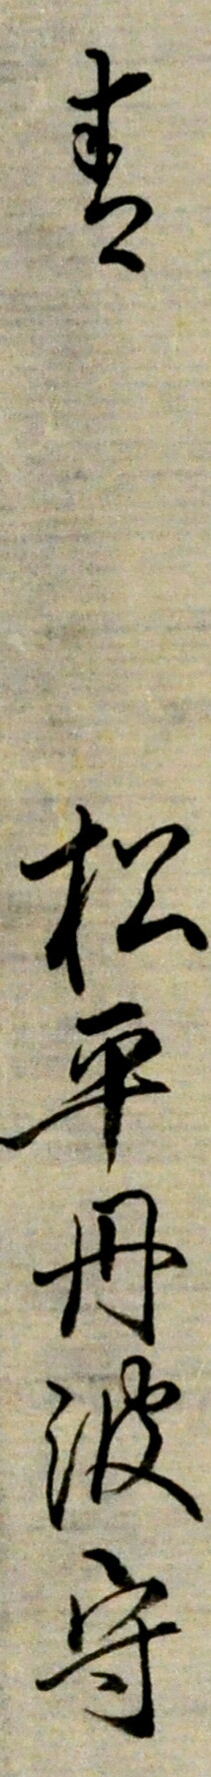青松平丹波守
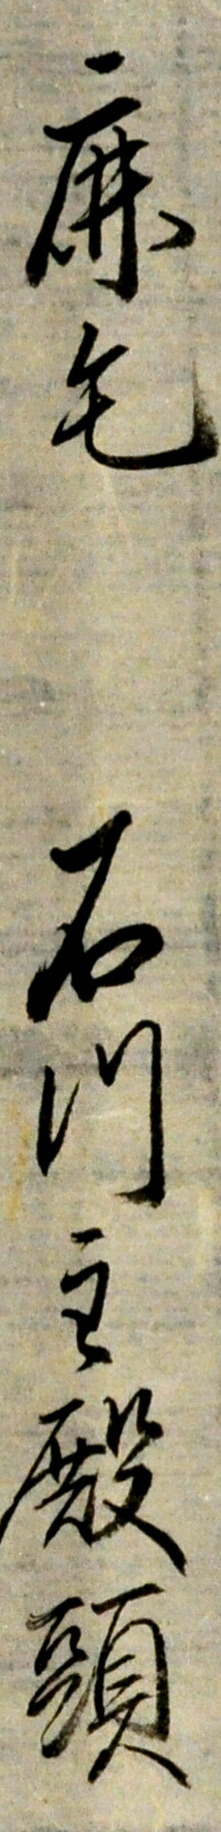鹿毛石川主殿頭
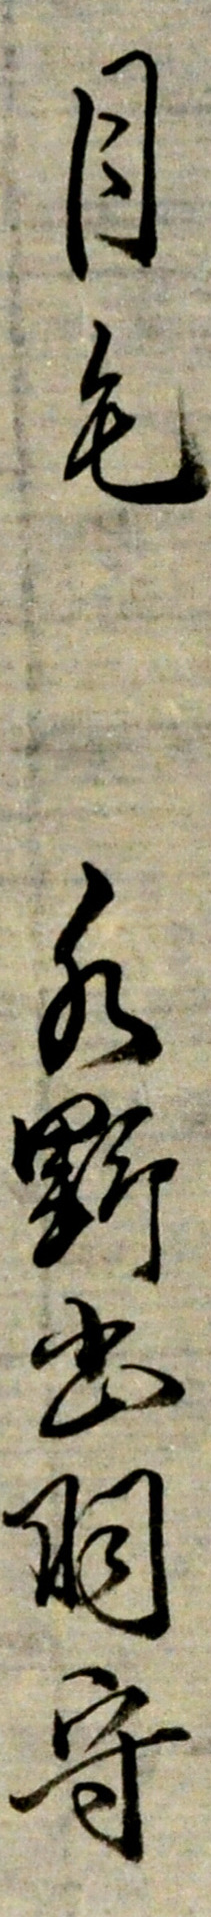月毛水野出羽守
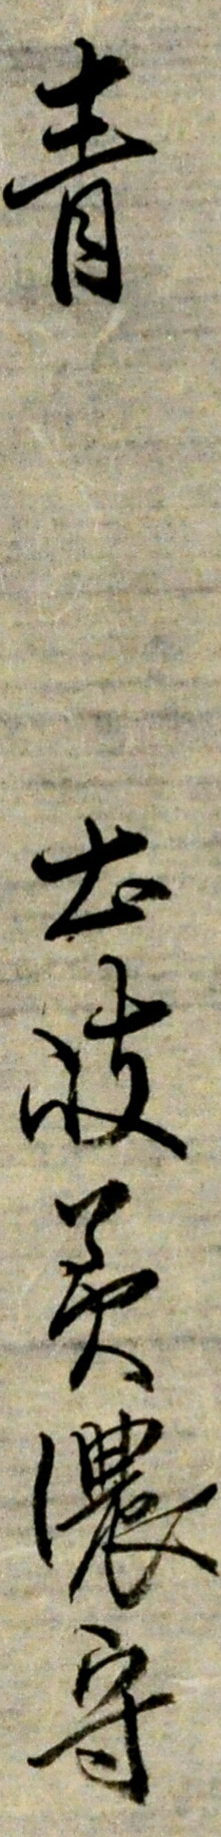青土岐美濃守
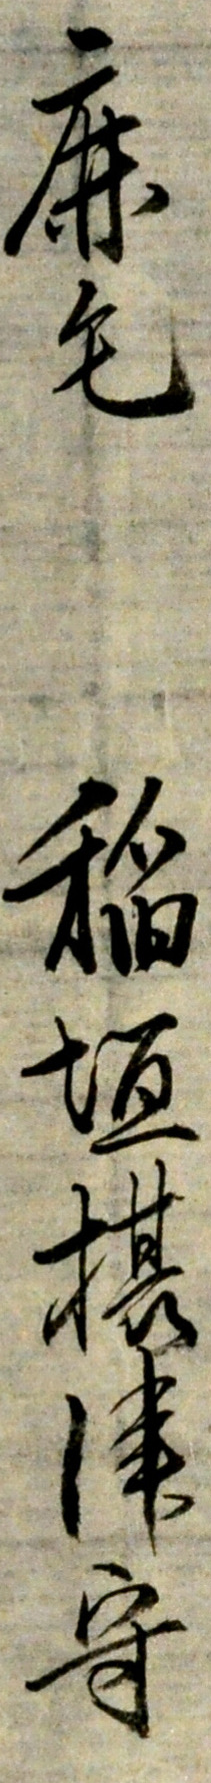鹿毛稲垣摂津守
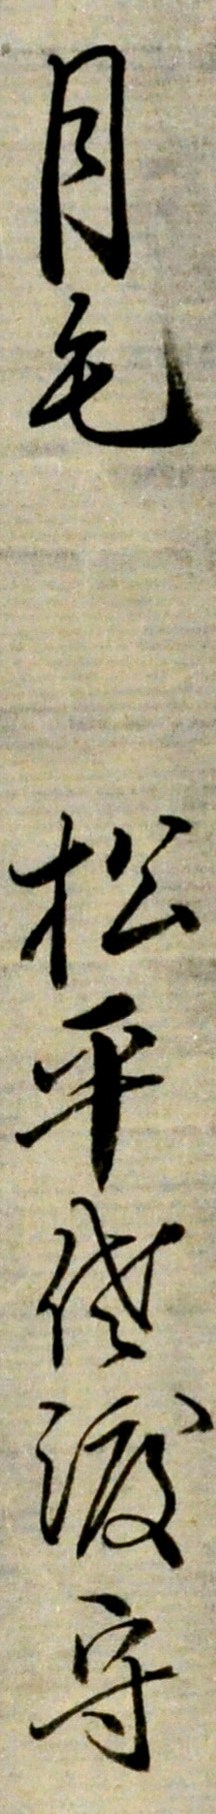月毛松平佐渡守
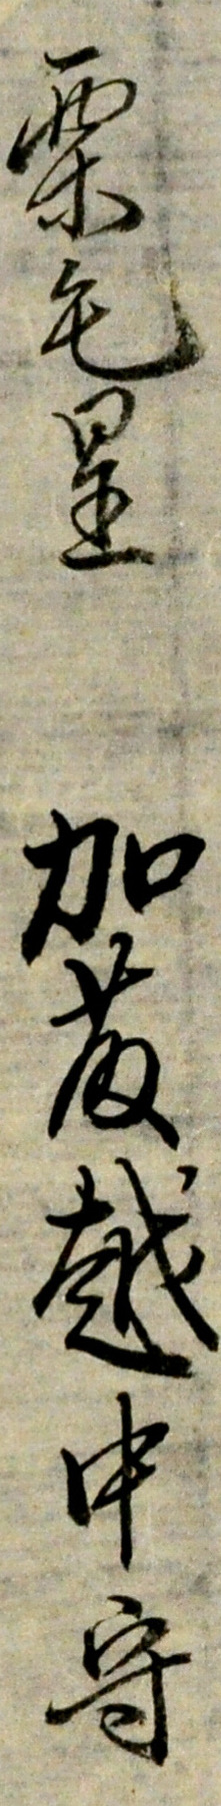栗毛星加藤越中守
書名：吹上御庭ニ於テ乗馬上覧ノ節留書外
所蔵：伊那市立高遠町図書館・合同会社AMANE
